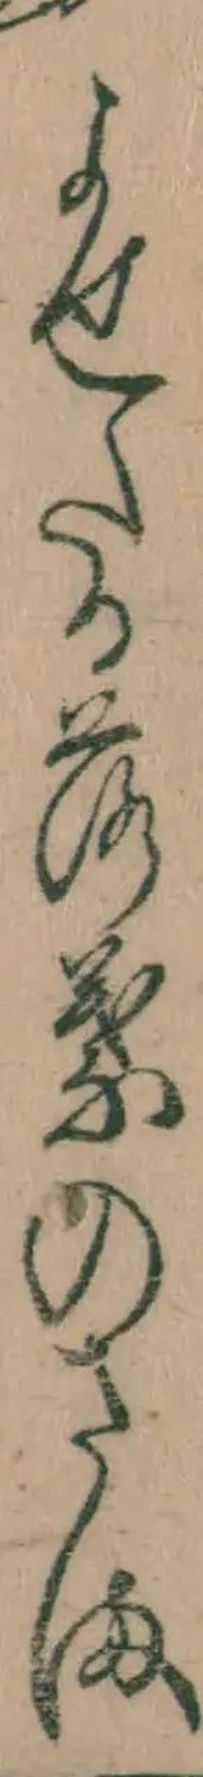よせたる落葉のさま
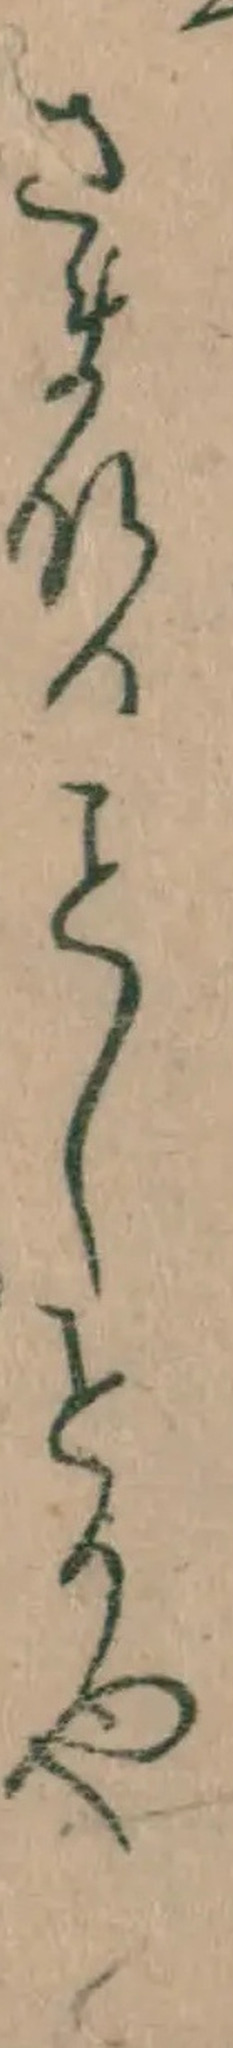さまなることしとかや
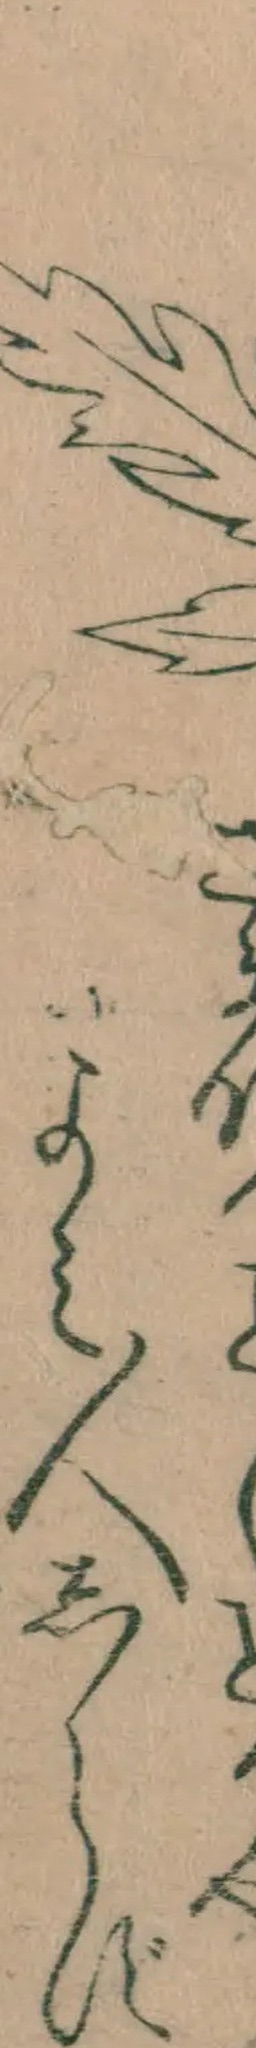よみ人しらず
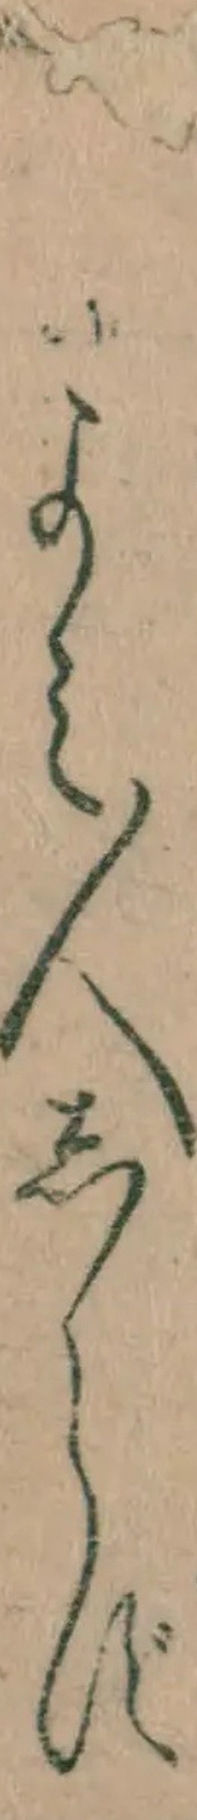よみ人しらず
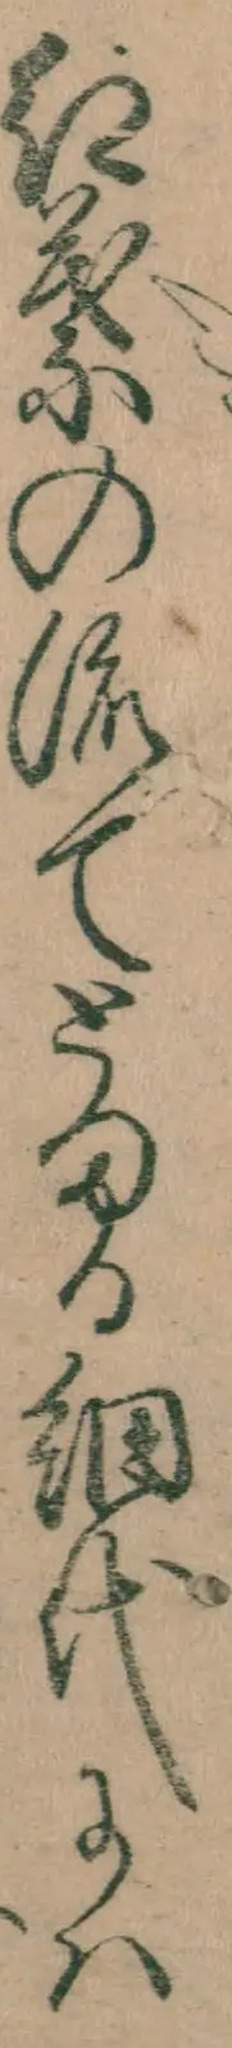紅葉の流てとまる網代には
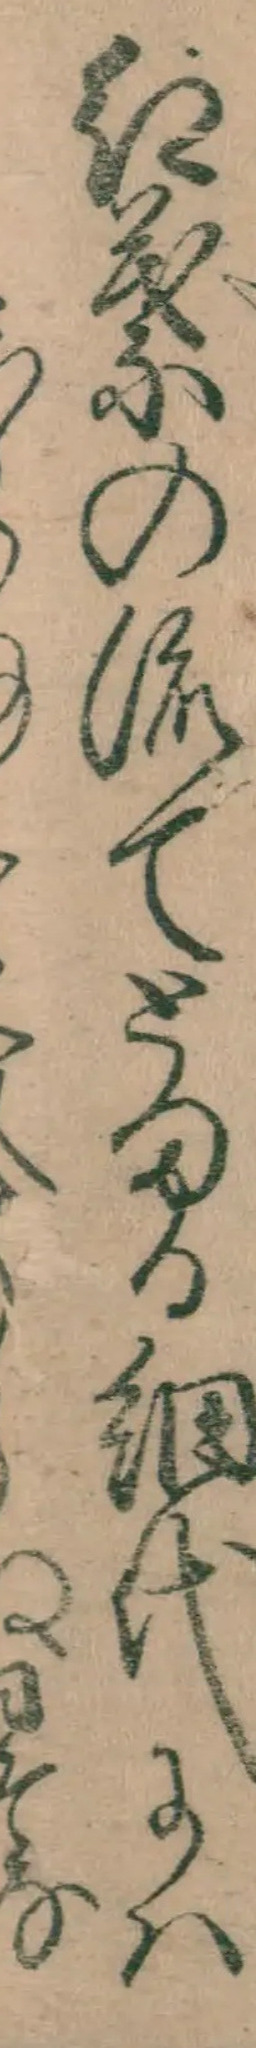紅葉の流てとまる網代には
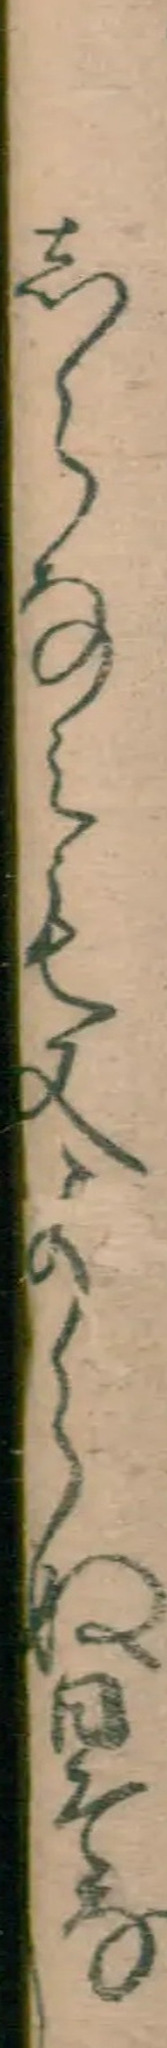しらなみも又よらぬ日そな
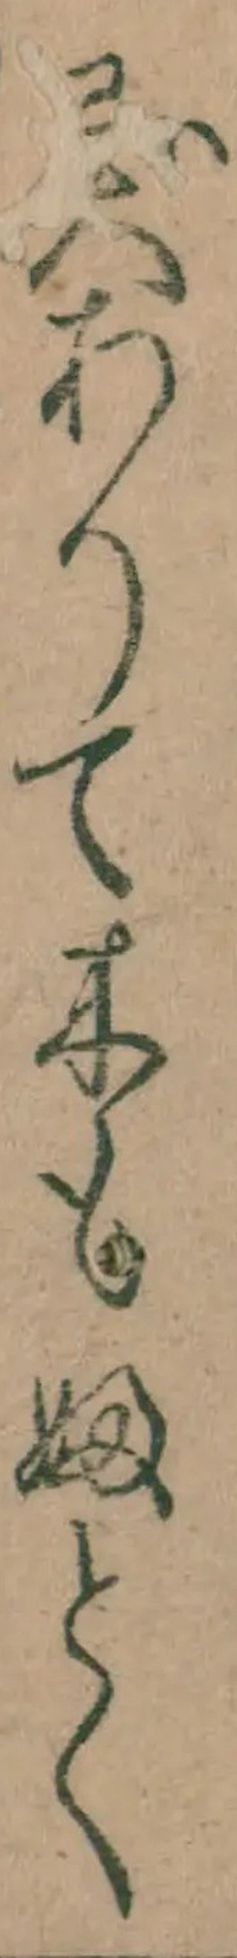異ありて木もふとく
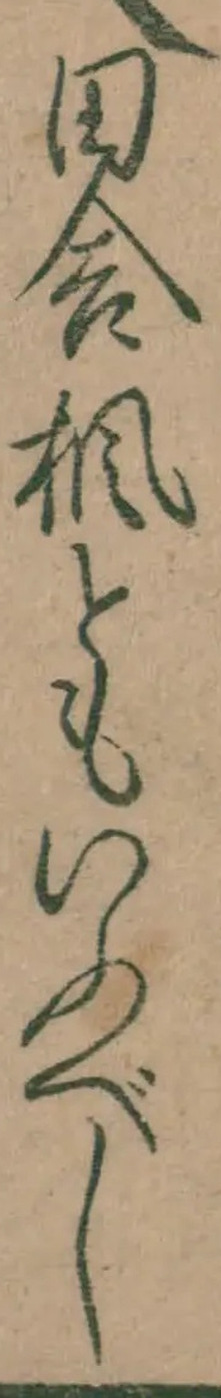田舎楓ともいふべし
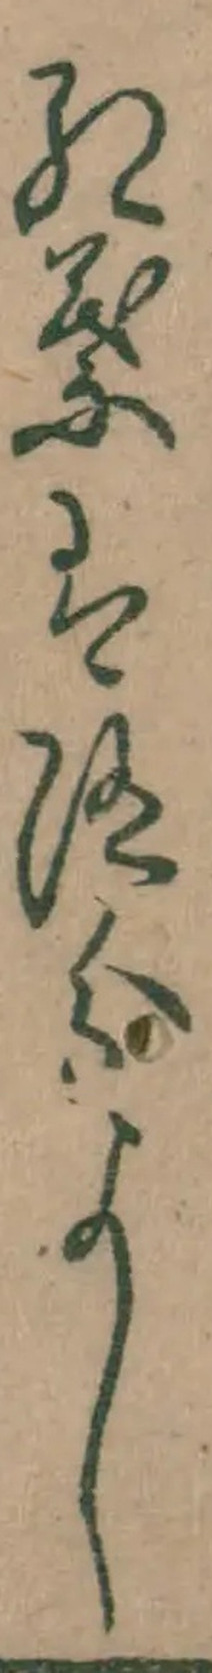紅葉は随分よし
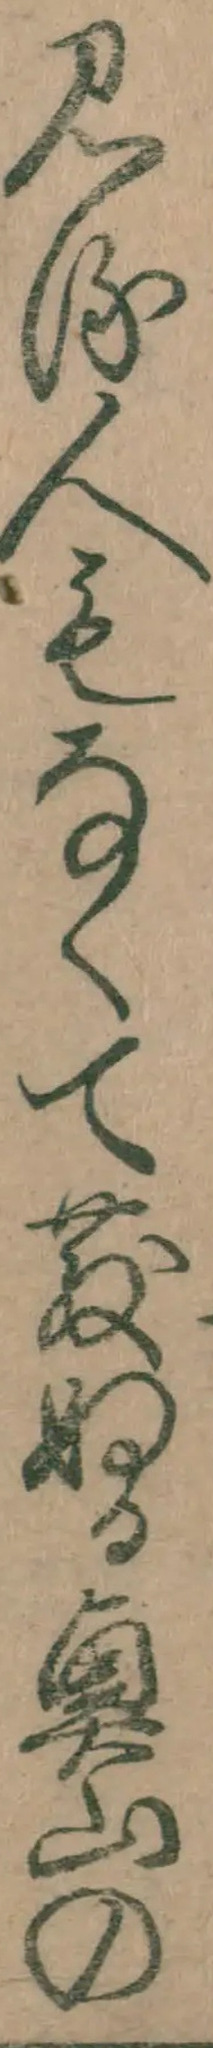見る人もなくて散ぬる奥山の
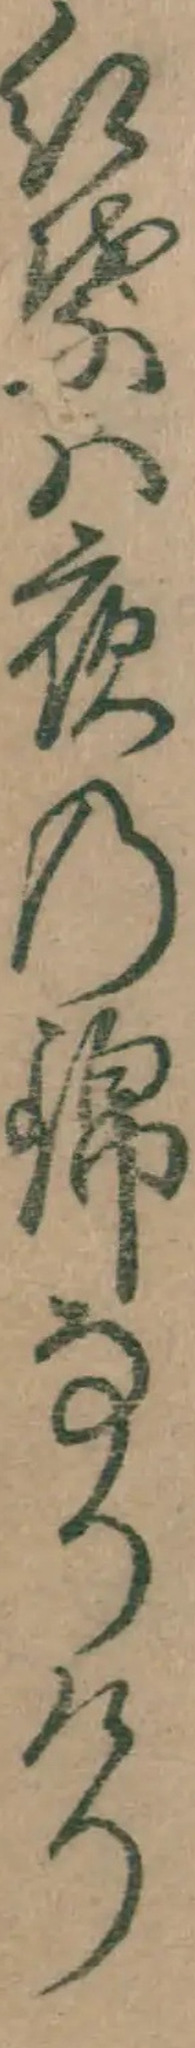紅葉は夜の錦なりけり

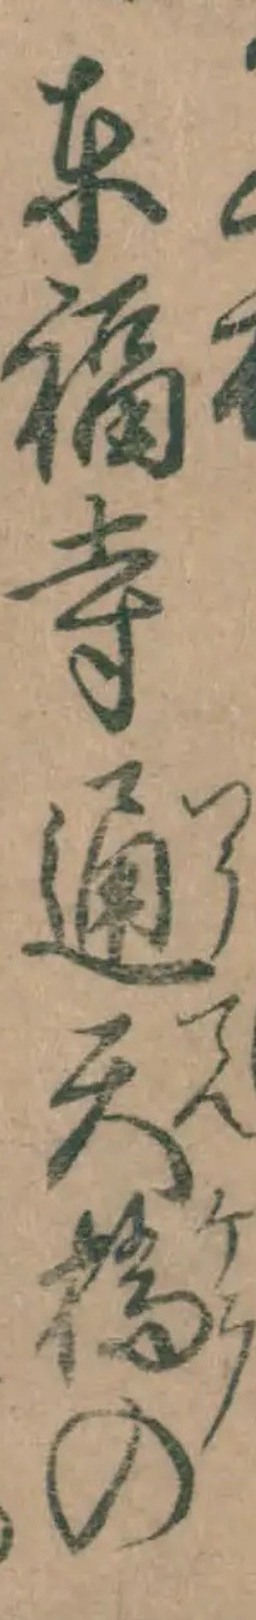東福寺通天橋の
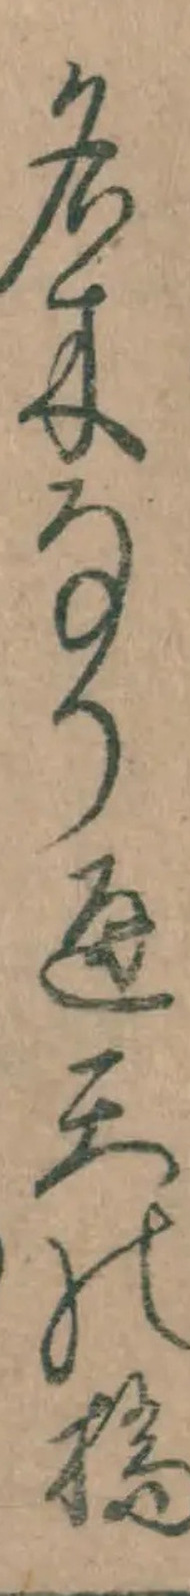名木なり通天の橋
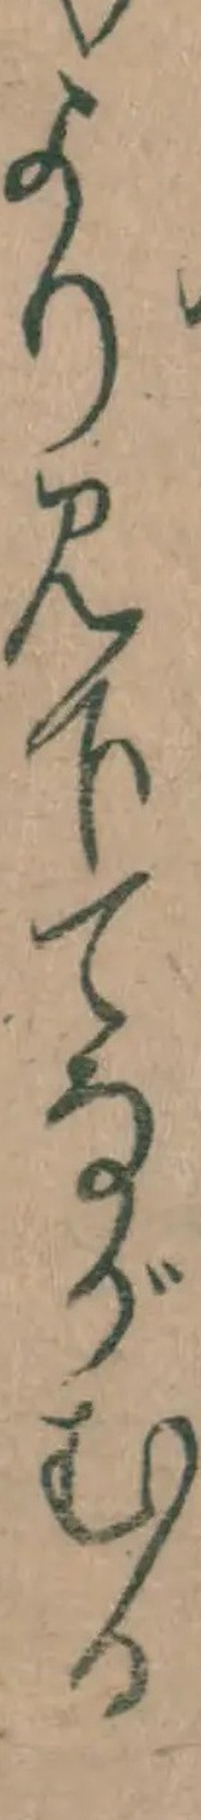より見下てながむる
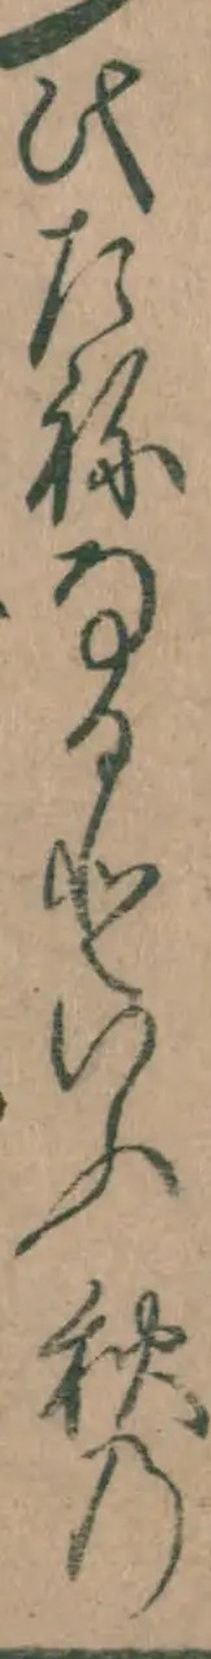此たねなるといふ秋の
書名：紅葉集
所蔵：国立国会図書館 National Diet Library, JAPAN
